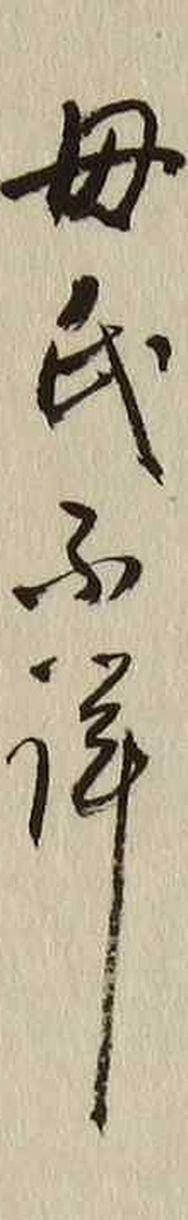母氏不詳
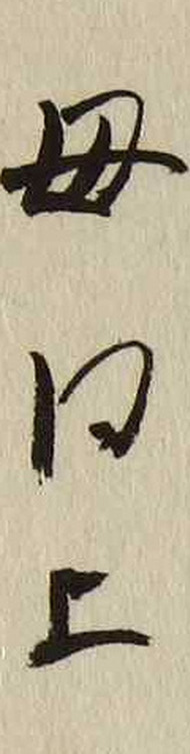母同上
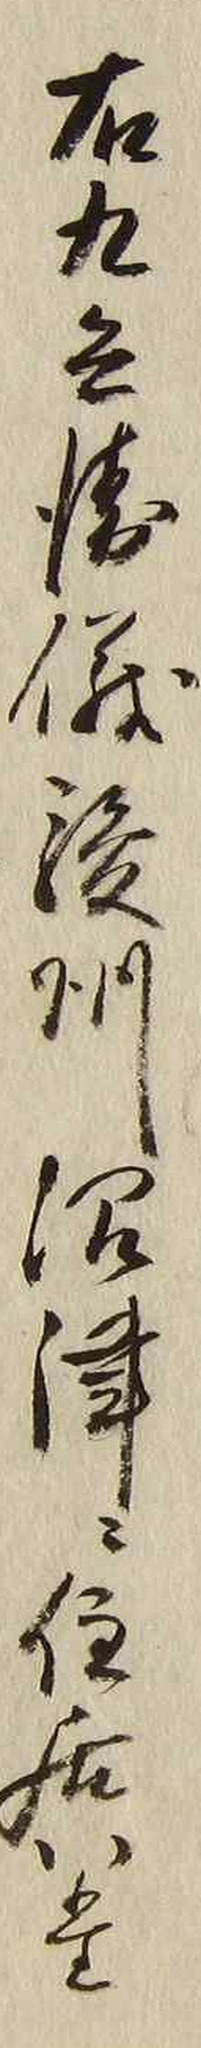右九兵衛儀駿州沼津ニ住居いた
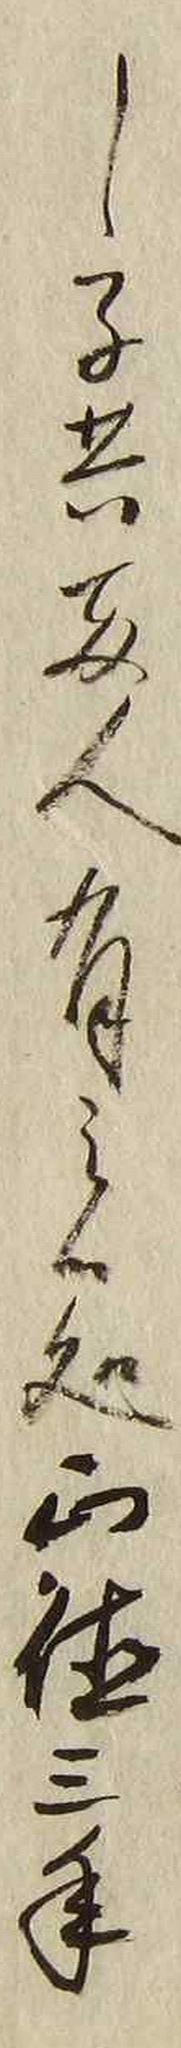し子共両人有之候処正徳三年

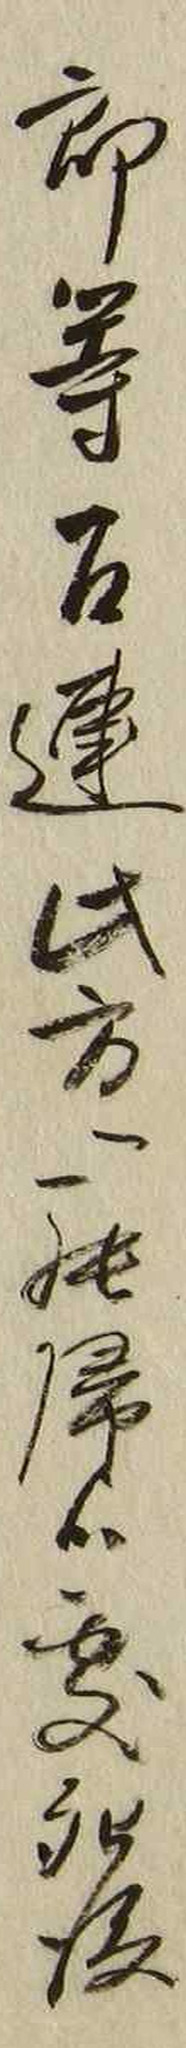郎等召連此方へ罷帰候処死後
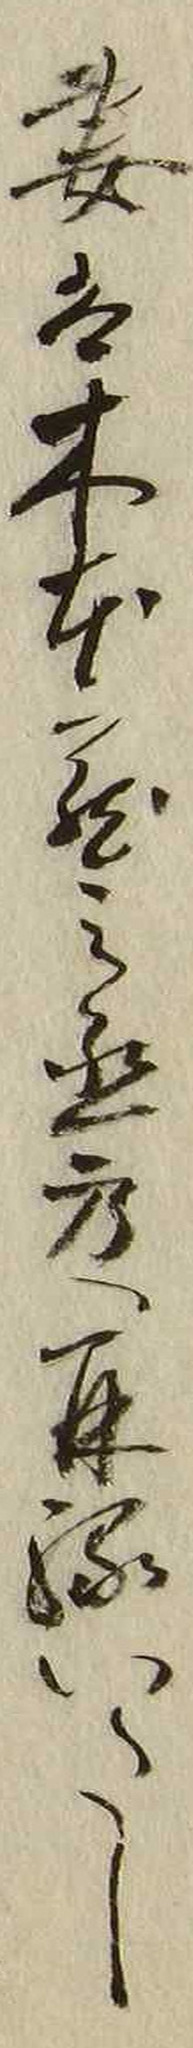妻は木本蔵之丞方へ再縁いたし
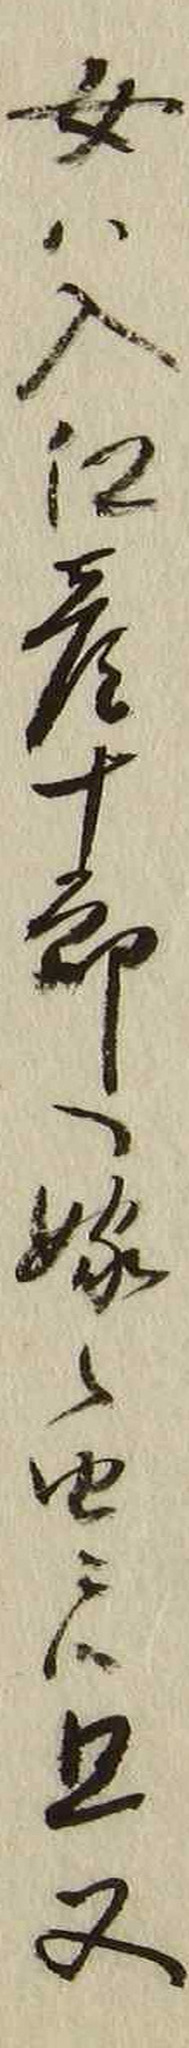女ハ入江彦十郎へ嫁候由ニ候且又
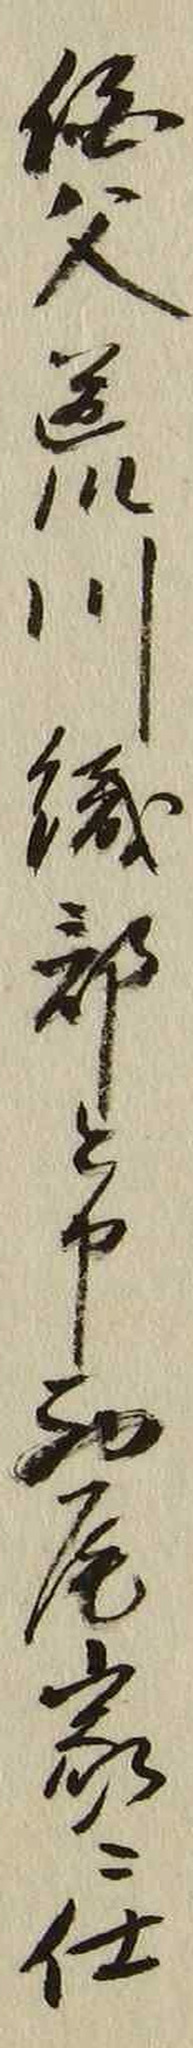伯父荒川織部と申西尾家に仕
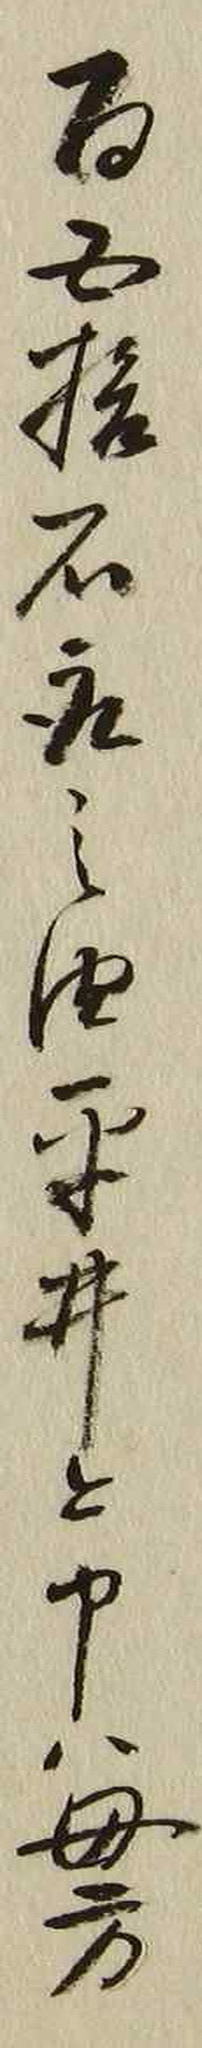百五拾石取之由平井と申ハ母方
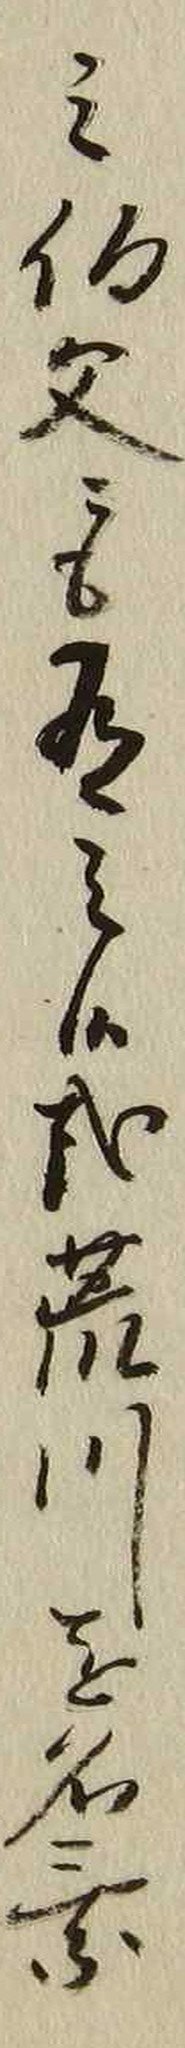之伯父ニも有之候哉荒川を名乗
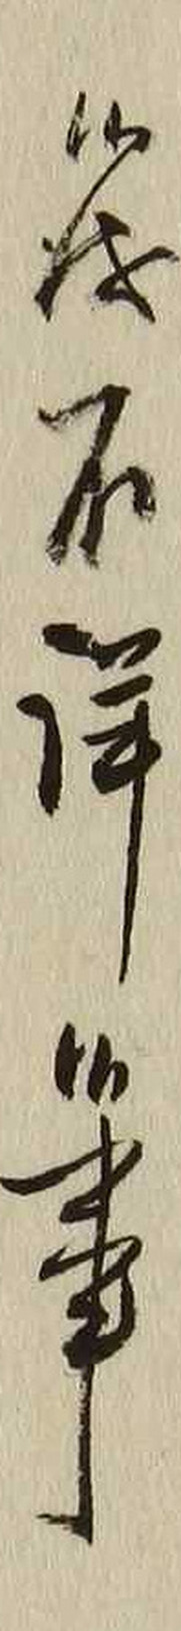候儀不詳候事
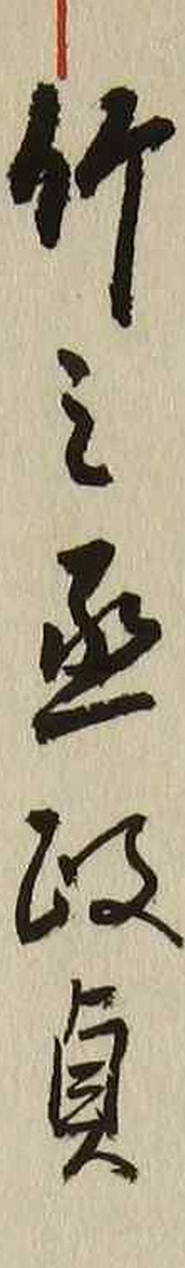竹之丞政貞
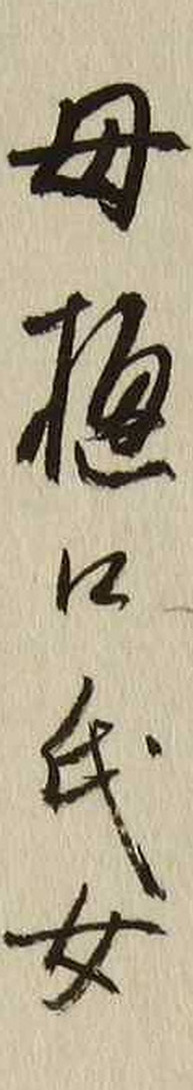母樋口氏女
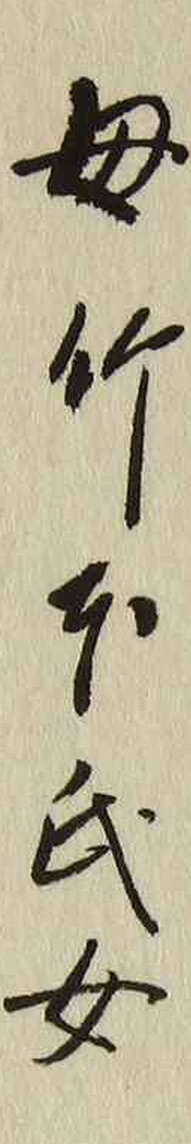母竹本氏女
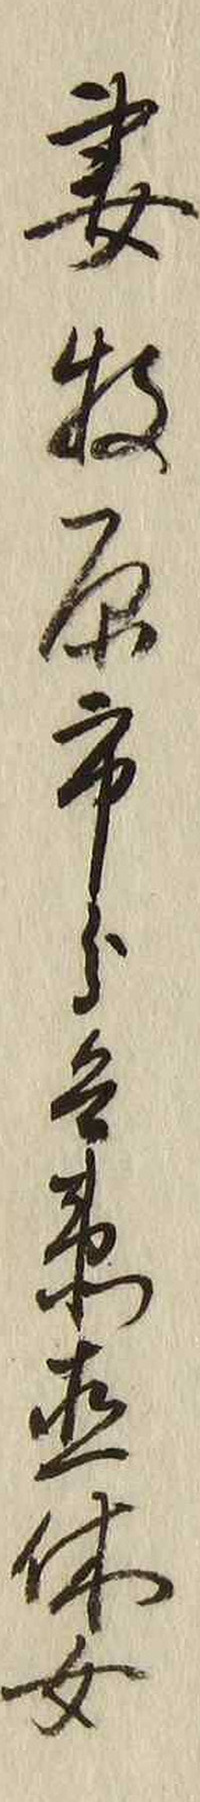妻牧原市郎兵衛直休女

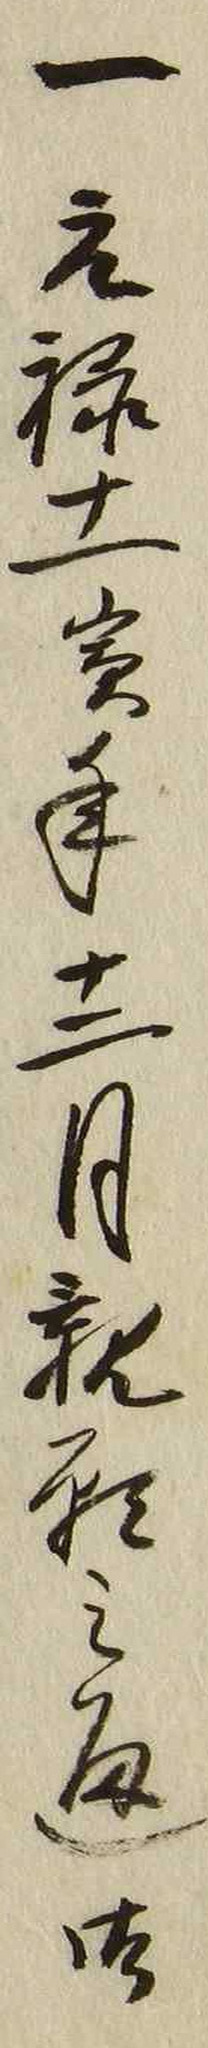一元禄十一寅年十二月親願之通御
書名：諸士系譜　巻之356　す之部6
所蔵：会津若松市立会津図書館
